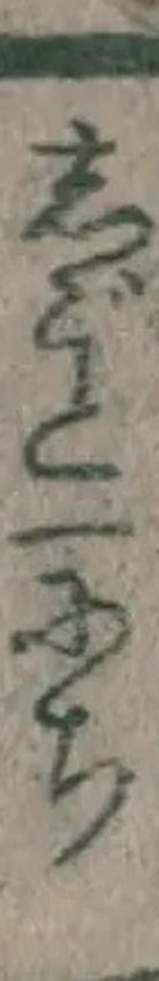しごと一にち
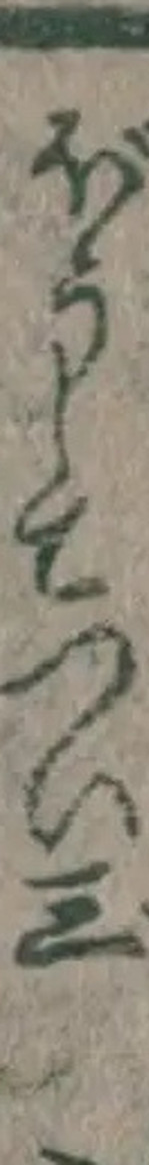ぼうしてつい三
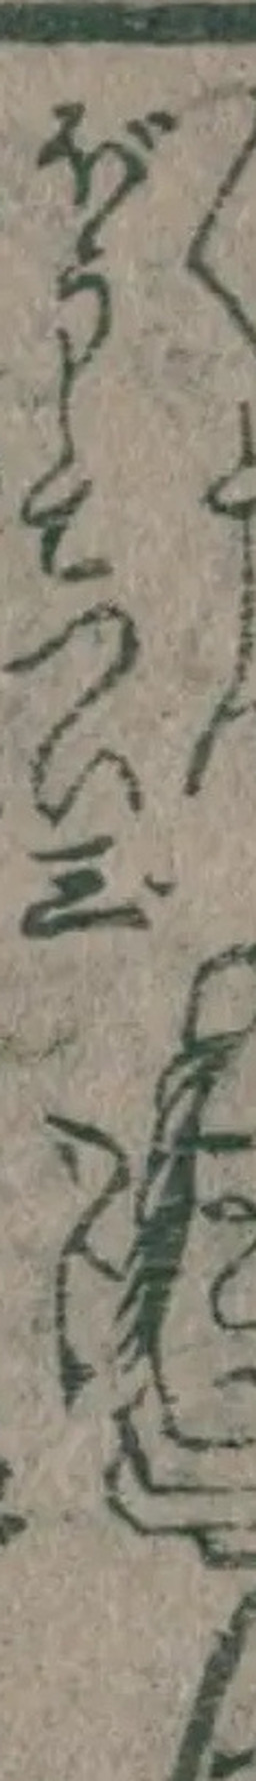ぼうしてつい三
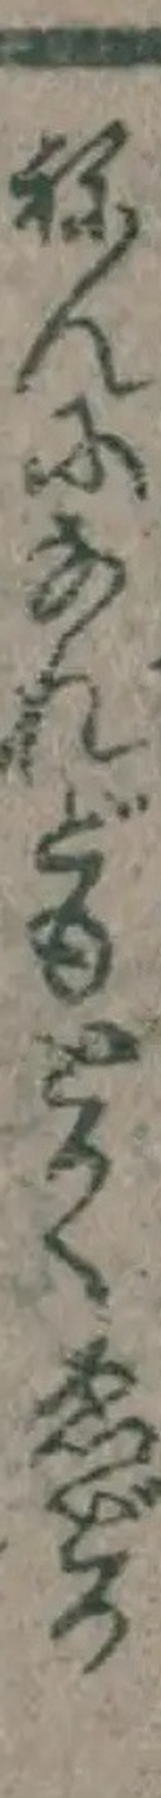ねんになれどもとかくゑどか
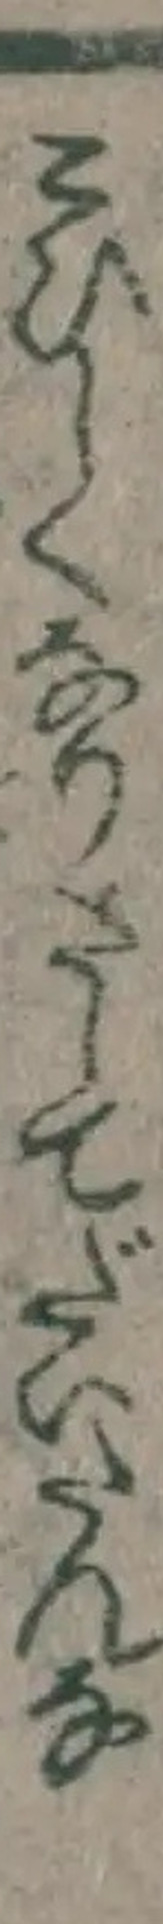こひしくなりさしてだいたんな
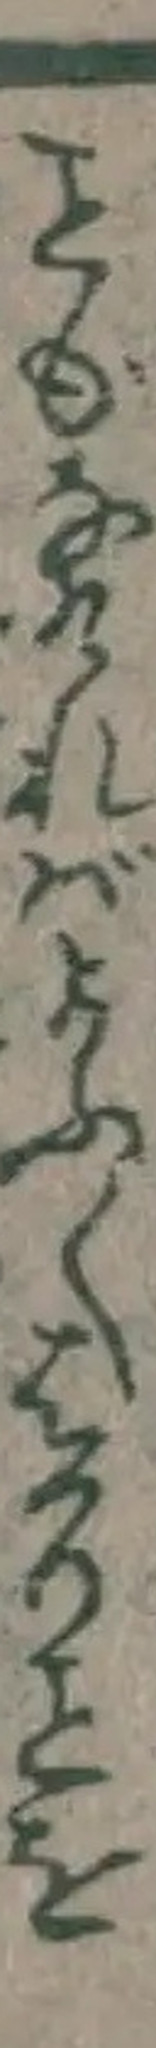こともなければよふ〳〵はかりことを
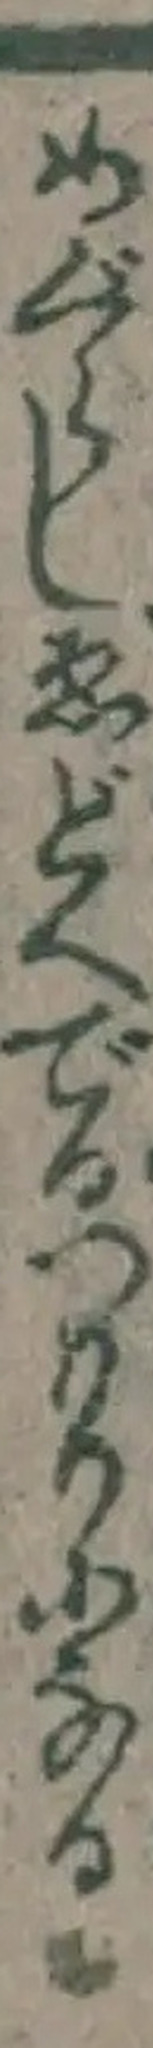めぐらしゑどへでるつもりになる

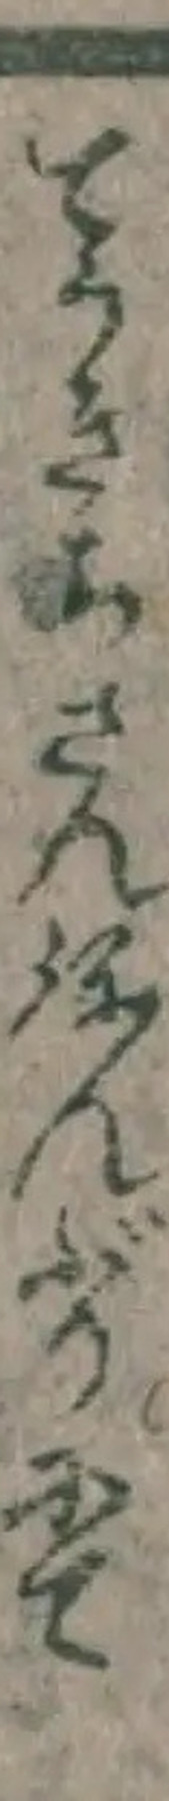てうきちさんねんぶりにて
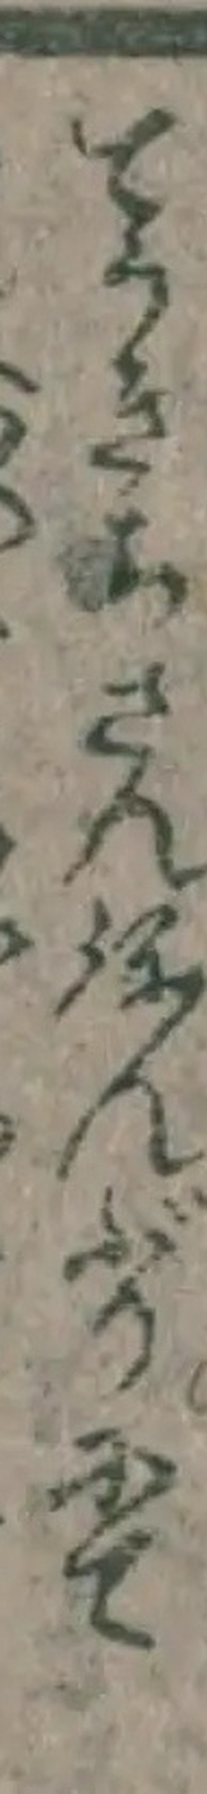てうきちさんねんぶりにて
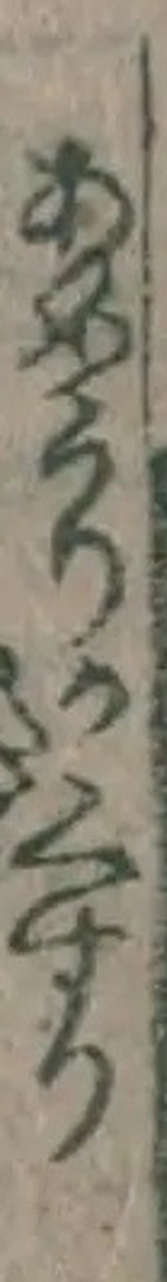あめうりかくすり
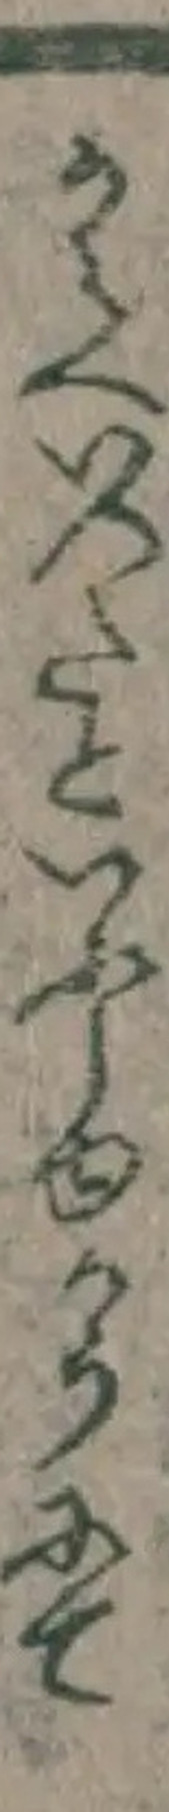からへいつたといふしゆかうにて
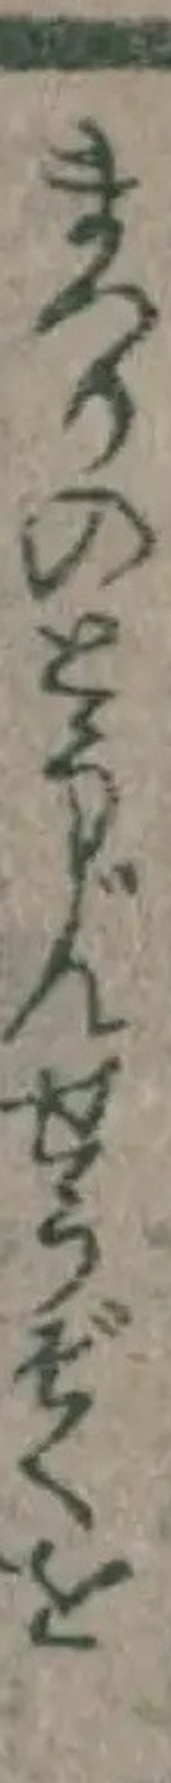まつりのとうじんそうぞくを
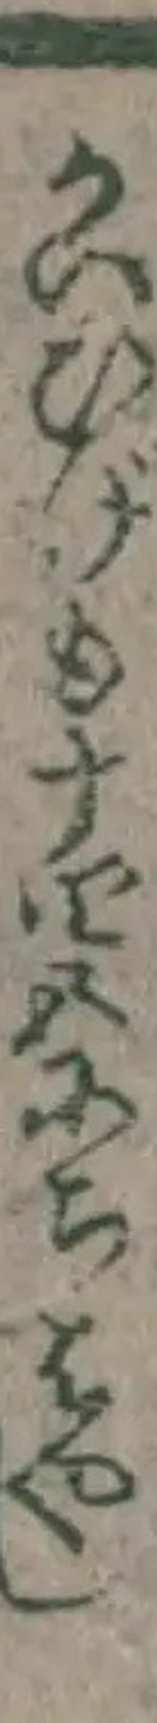かいひげも十四五にちはやし
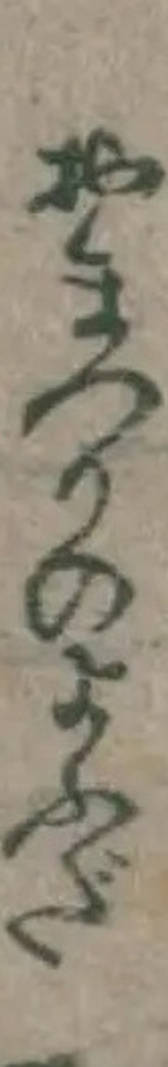おまつりのよふだ
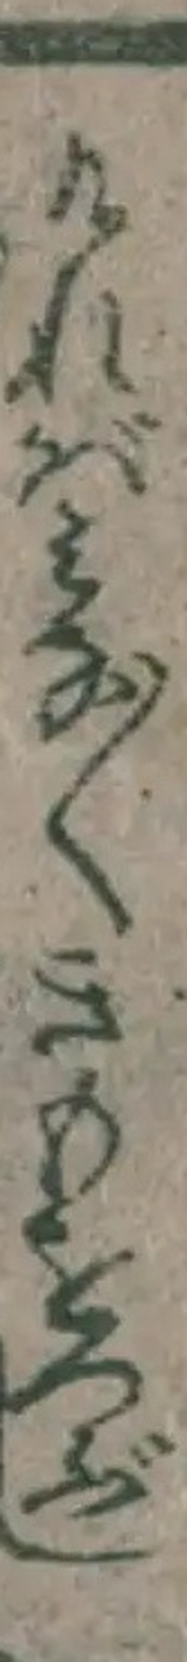ければみな〳〵きもをつぶし
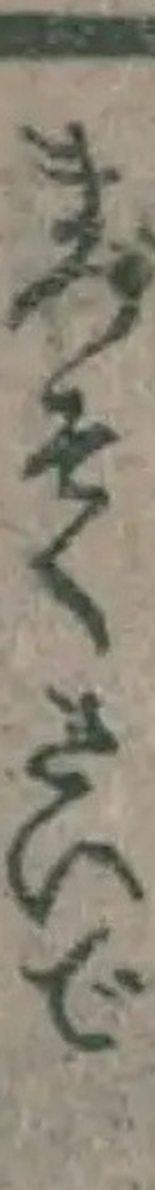まづそくさいで
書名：縦筒放唐の噺 3巻
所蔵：国立国会図書館 National Diet Library, JAPAN
